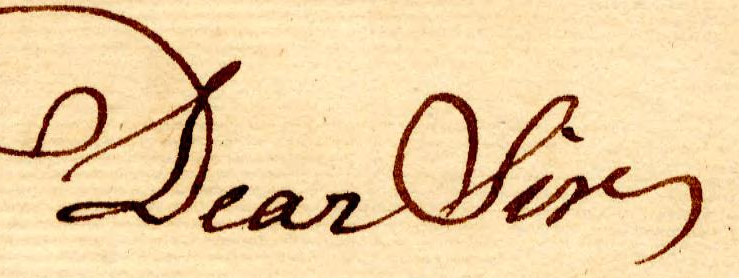Dear Sir
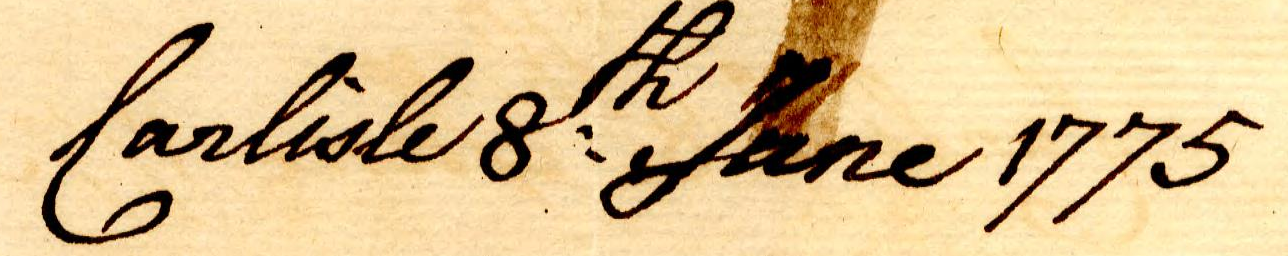Carlisle 8^th. June 1775
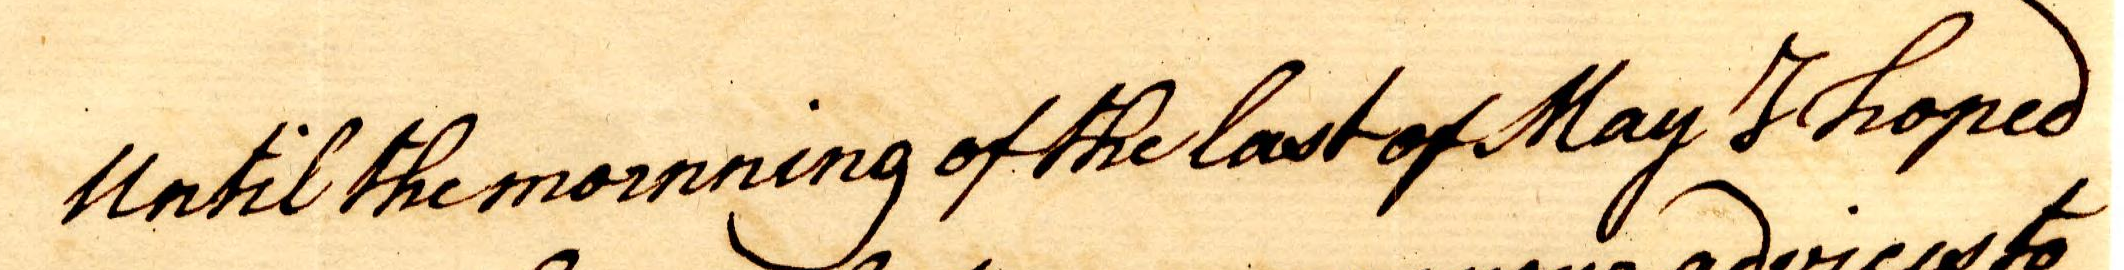Until the mornning of the last of May I hoped
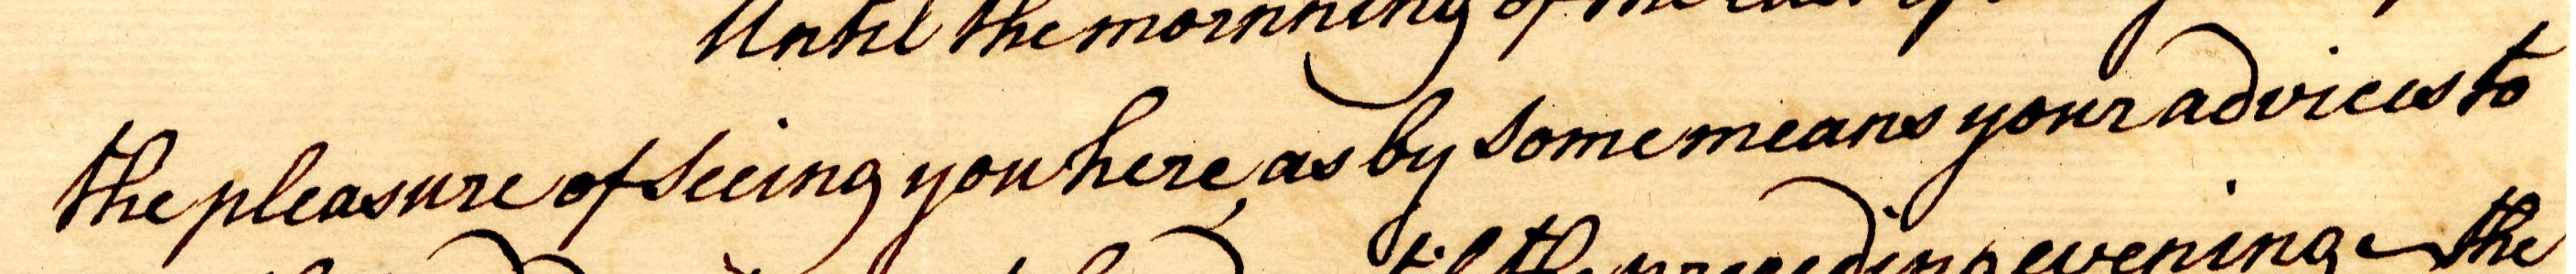the pleasure of Seeing you here, as by some means your advices to
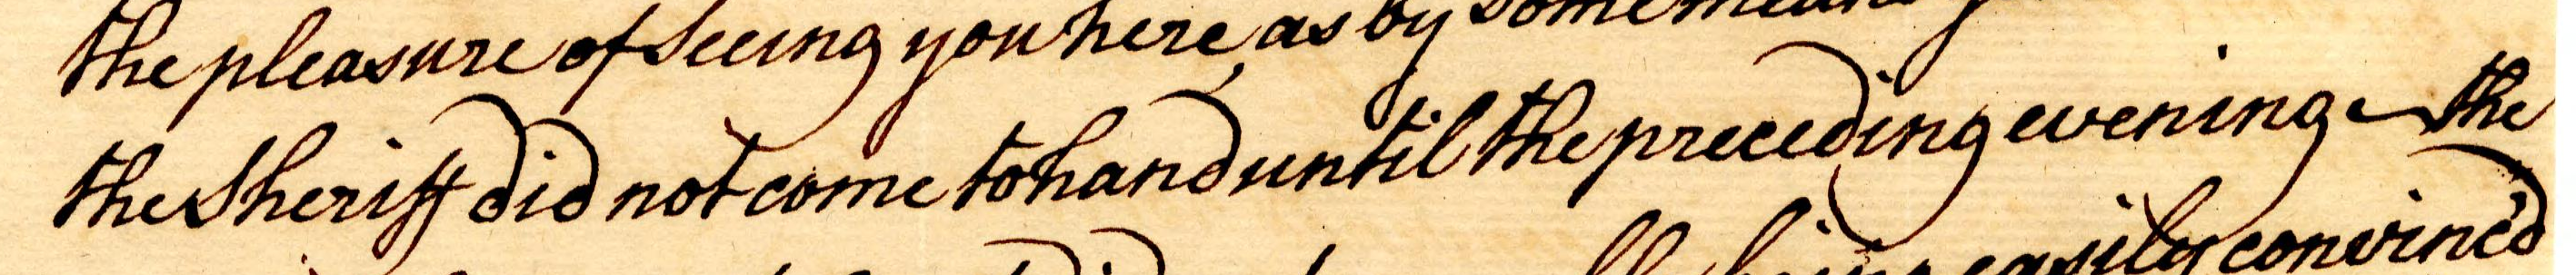the Sheriff did not come to hand until the preceding evening the
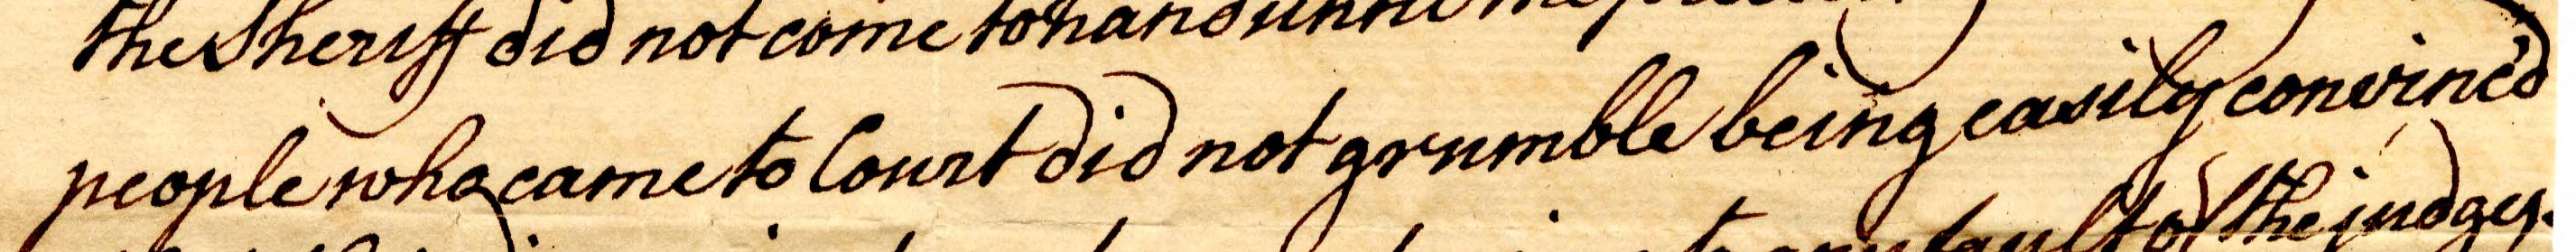people who came to Court did not grumble being easily convinc'd
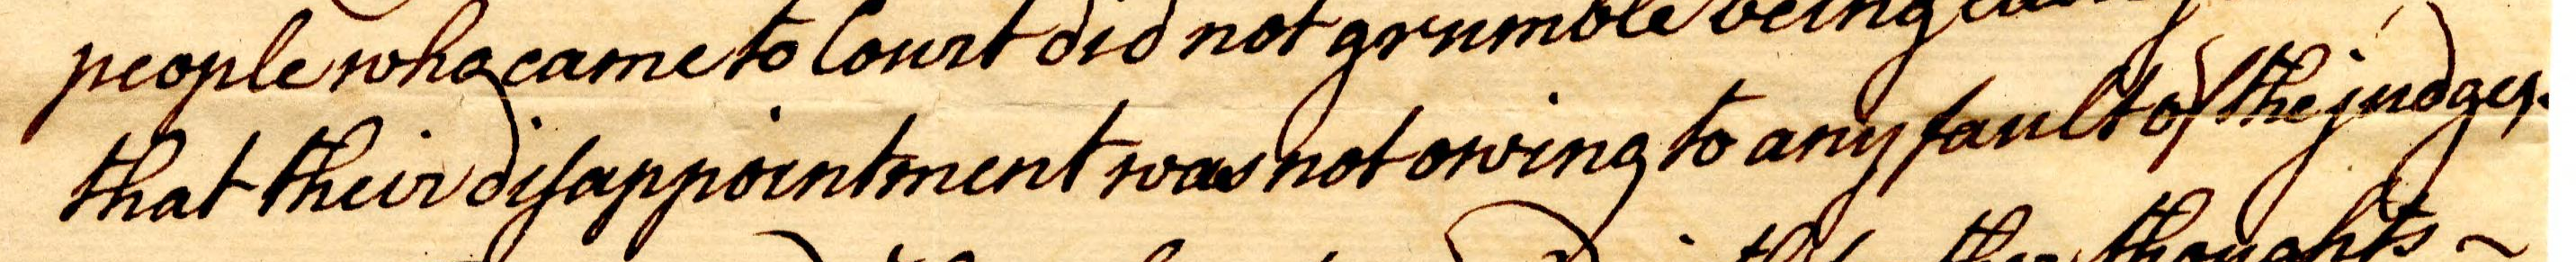that their disappointment was not owing to any fault of the judges.
